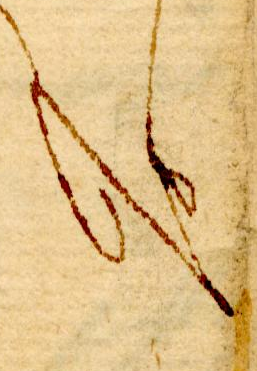To
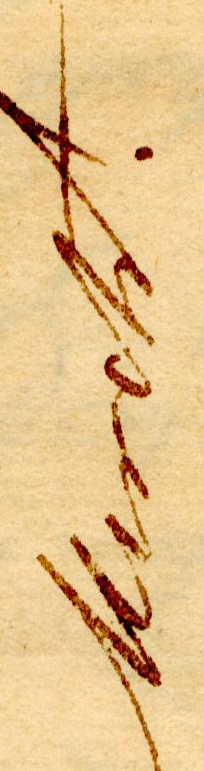Merch^t
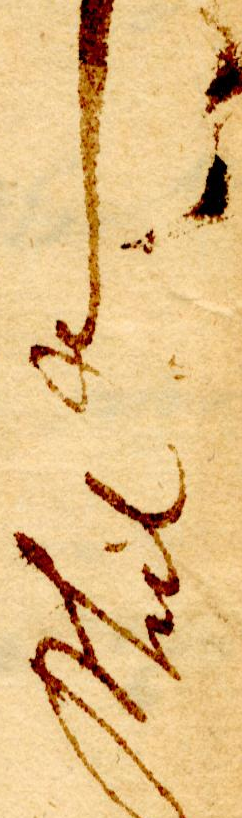Phil^a
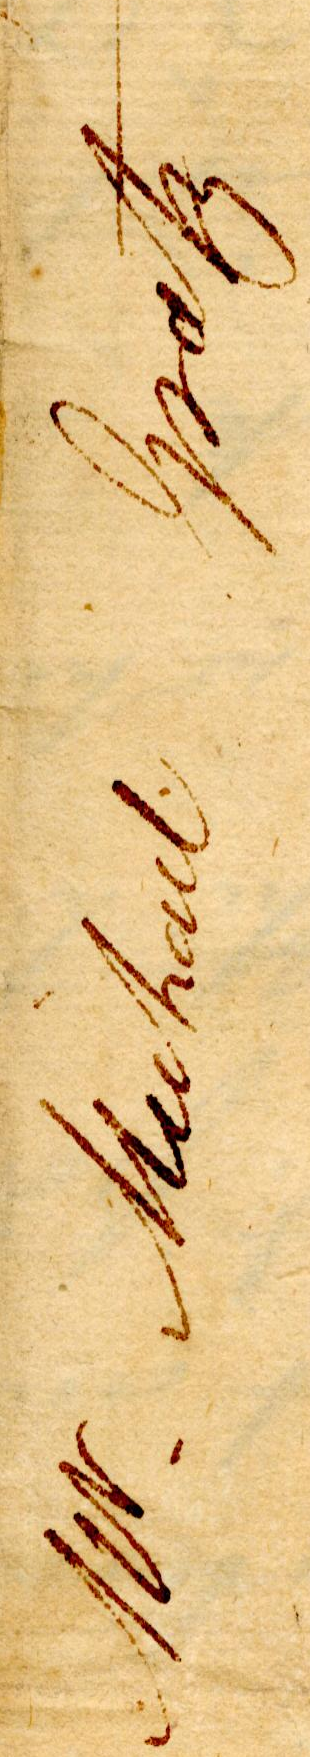M^r Michael Gratz
